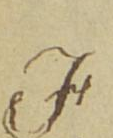F
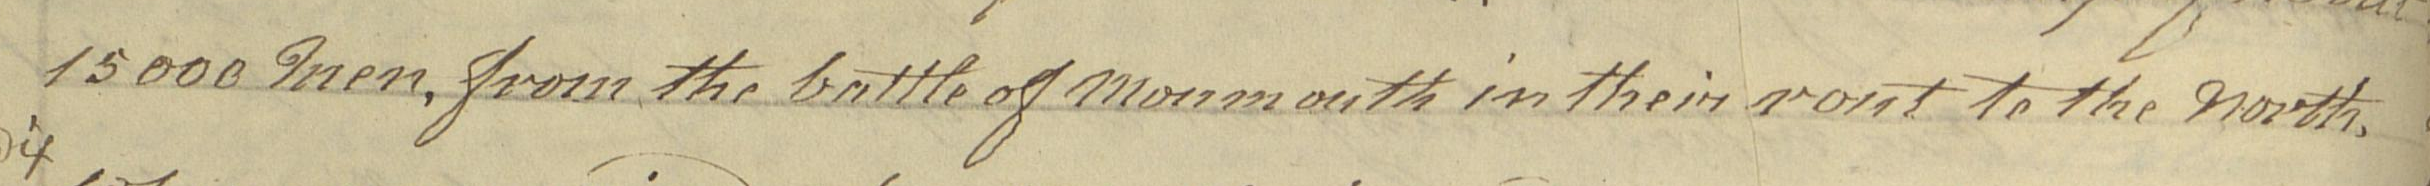15000 men, from the battle of monmouth in their rout to the North,
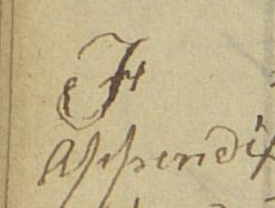Appendix
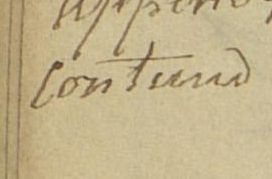Contend
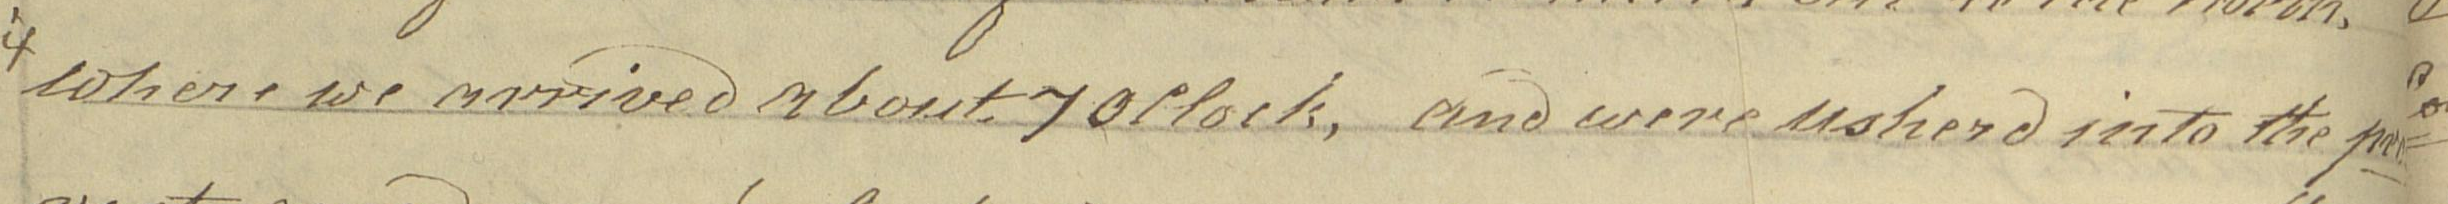where we arrived about 7 O Clock, and were usherd into the pro-
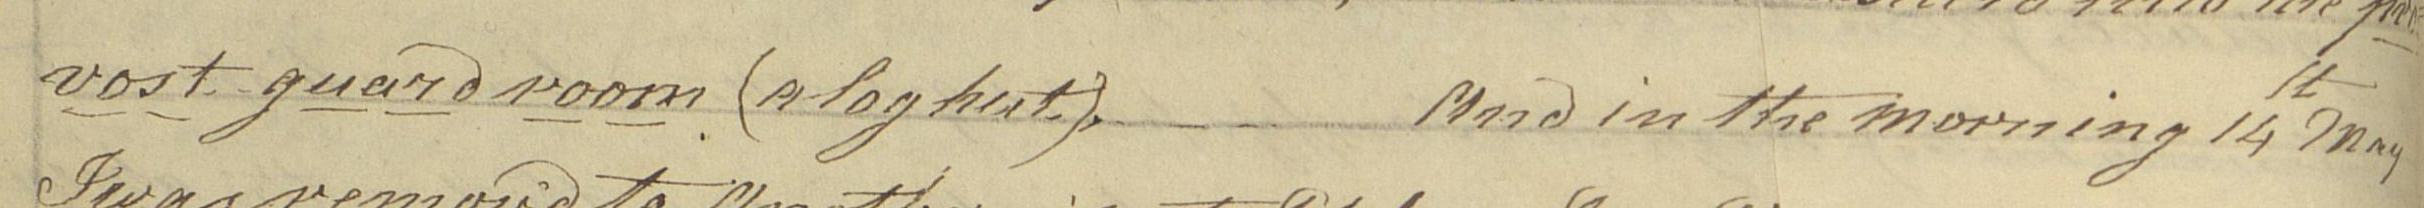vost guard room (a log hut). And in the morning 14^th May
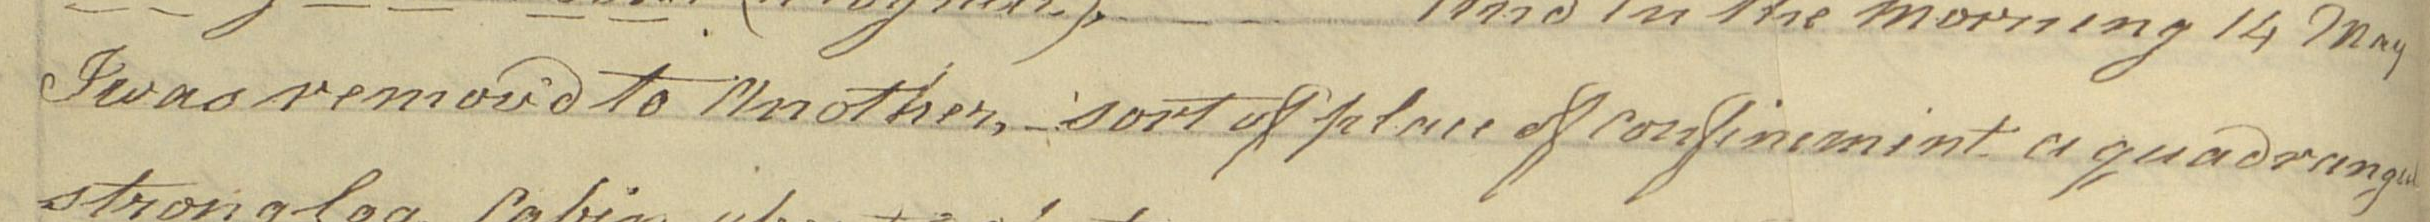I was remov'd to Another, sort of place of confinement a quadrangle
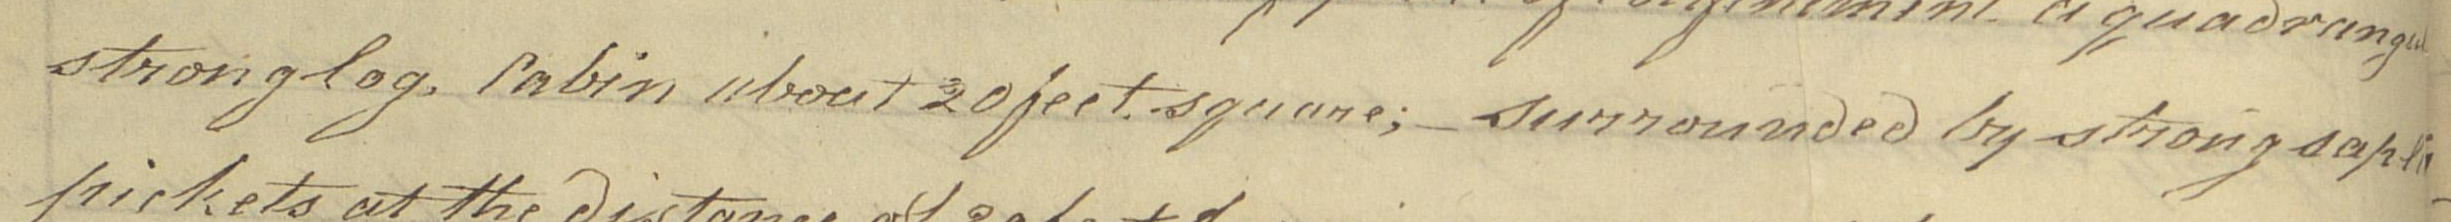strong log cabin about 20 feet square; surrounded by strong sap-
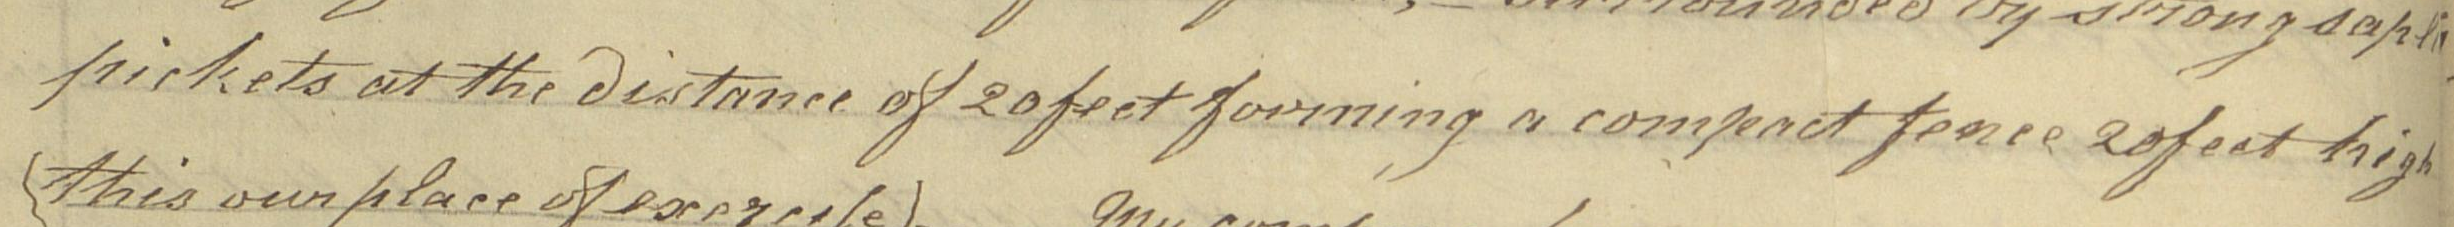pickets at the distance of 20 feet forming a compact fence 20 feet high
